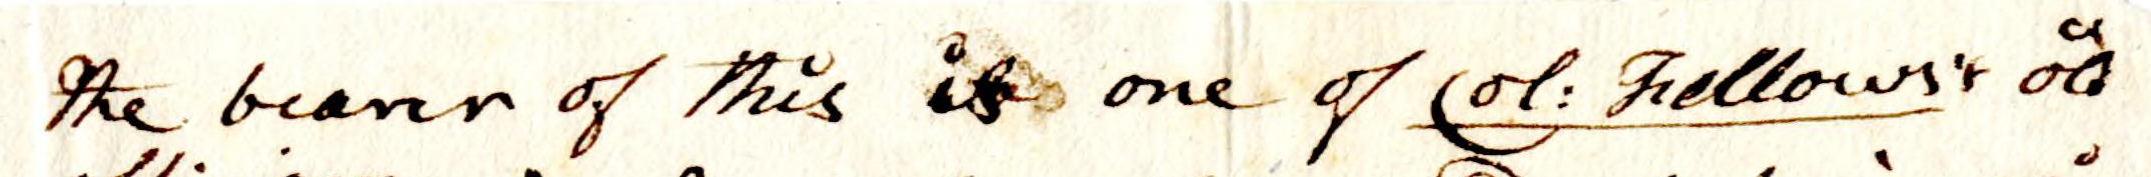the bearer of this is one of Col: Fellows's ol^d
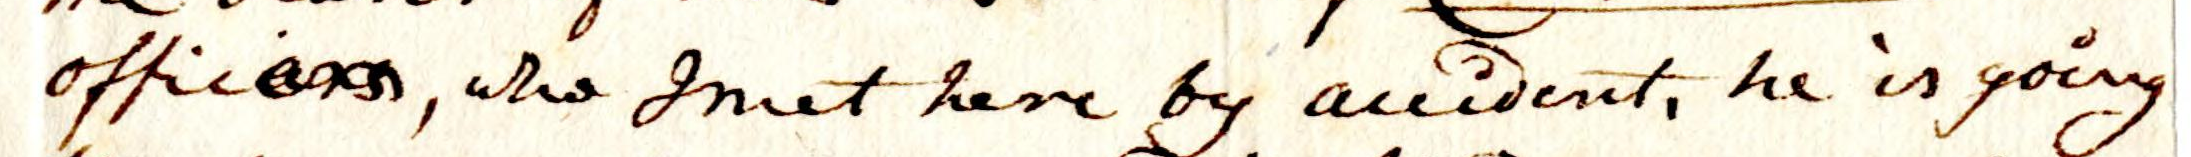officers, who I met here by accident, he is going
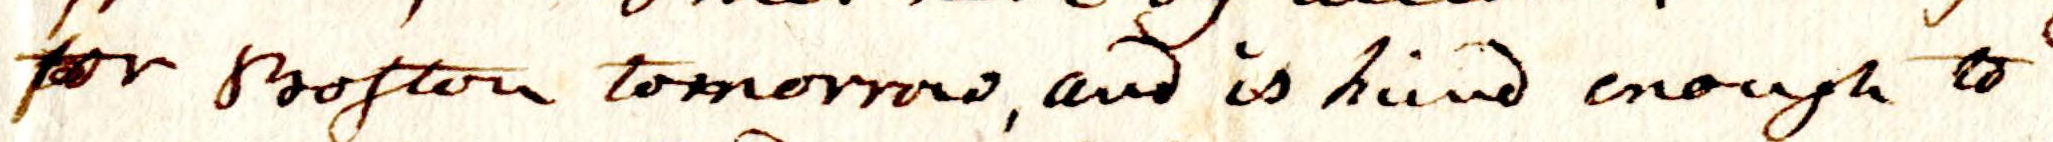for Boston tomorrow and is kind enough to
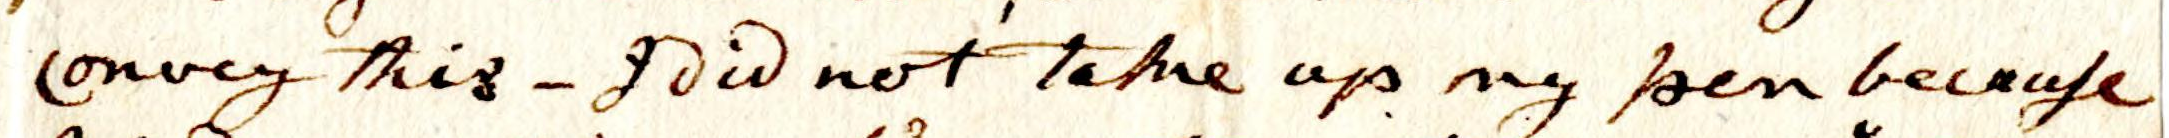convey this- I did not take up my pen because
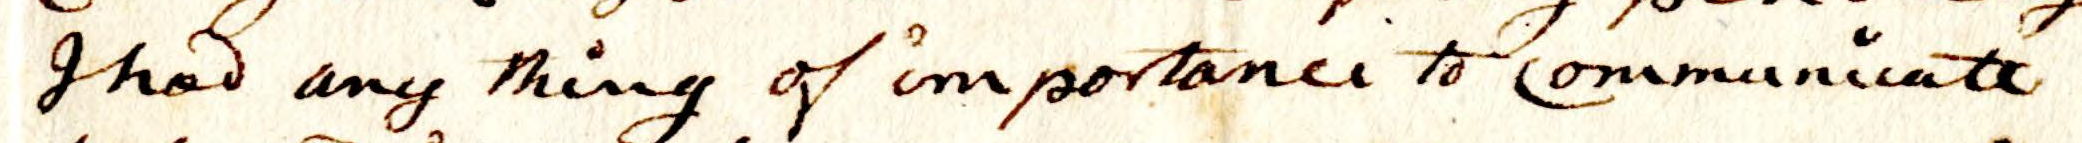I had any thing of importance to Communicate
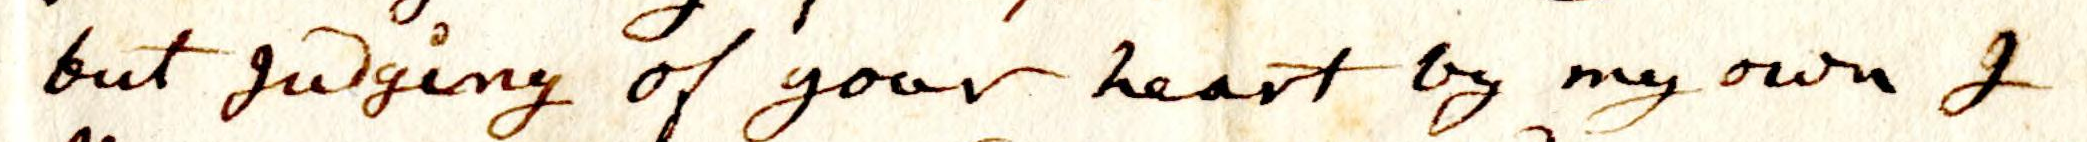but Judging of your heart by my own I
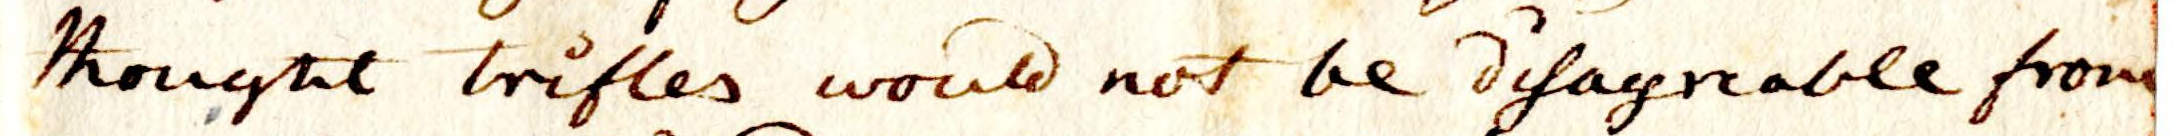thought trifles would not be disagreable from
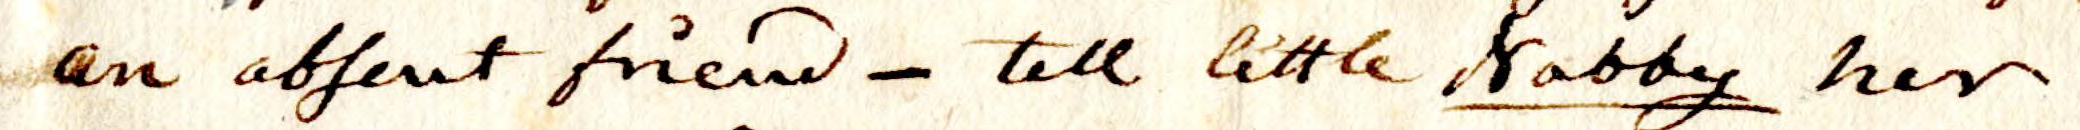an absent friend- tell little Nabby her
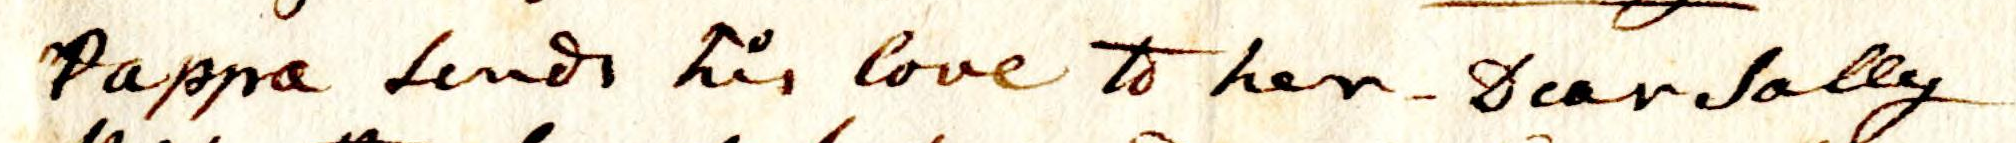Pappa lends his love to her- Dear Sally
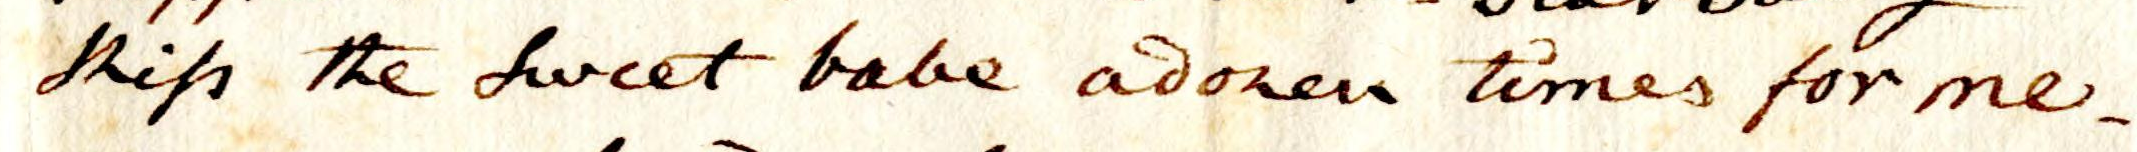Kiss the Sweet babe a dozen times for me-
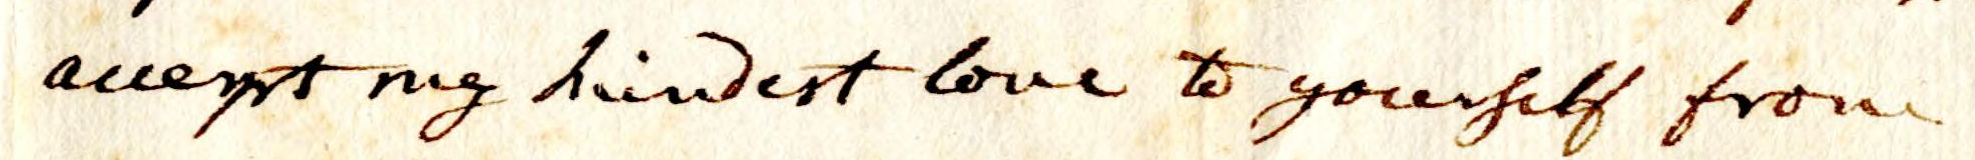accept my kindest love to yourself from
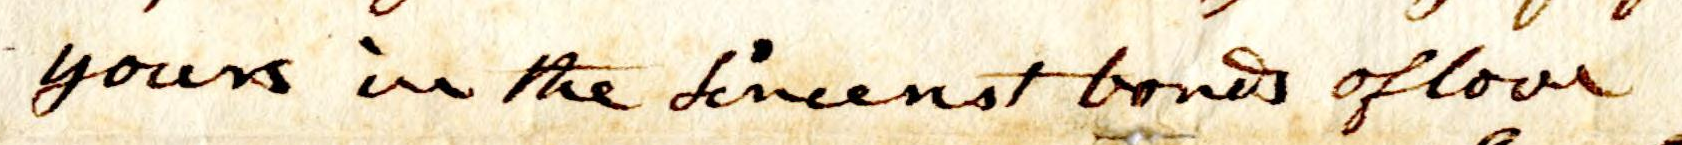yours in the sincerest bonds of love
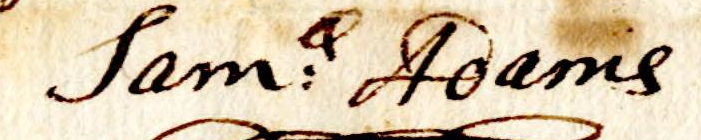Sam^l: Adams
